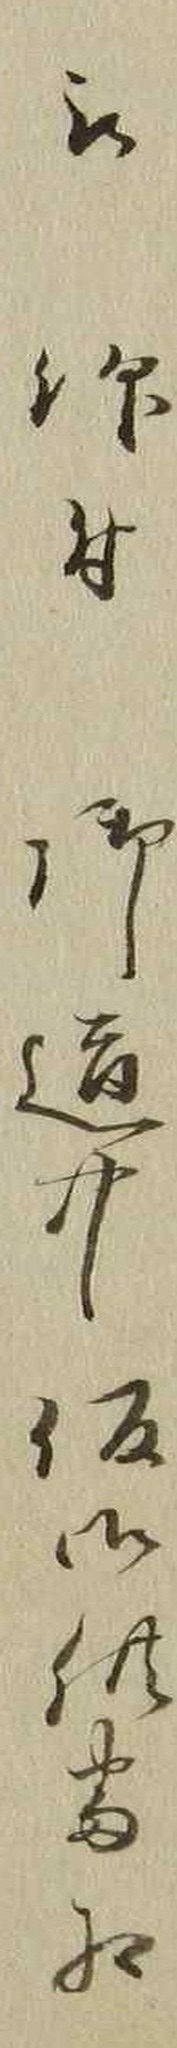被仰付御道中仮御供番相
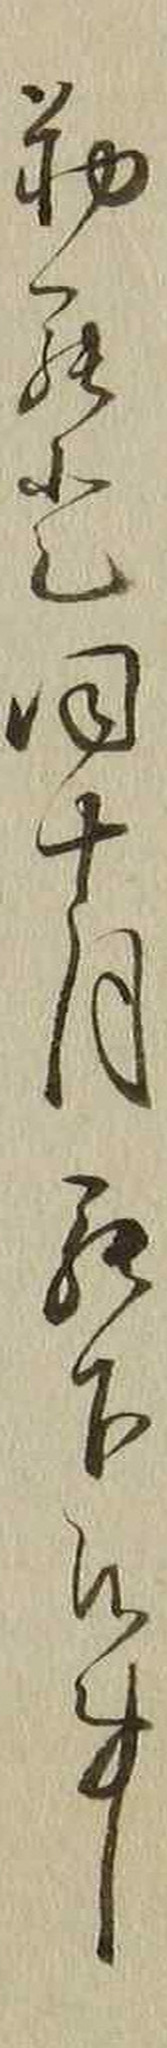勤罷登同十月罷下候事
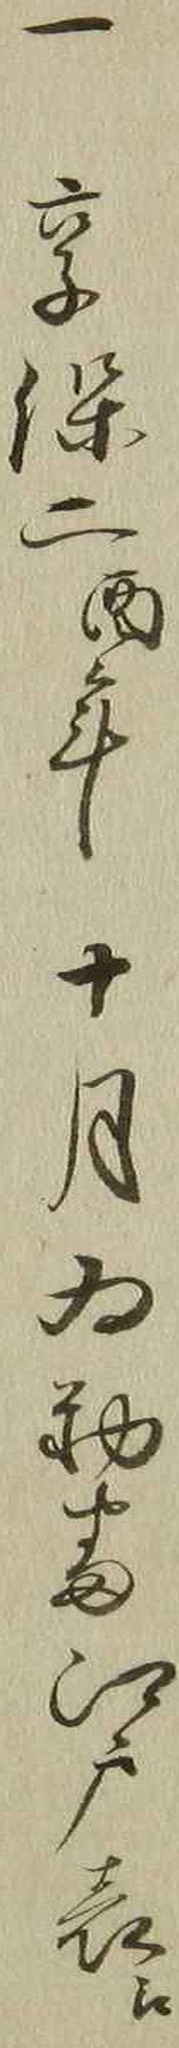一享保二酉年十月為勤番江戸表江
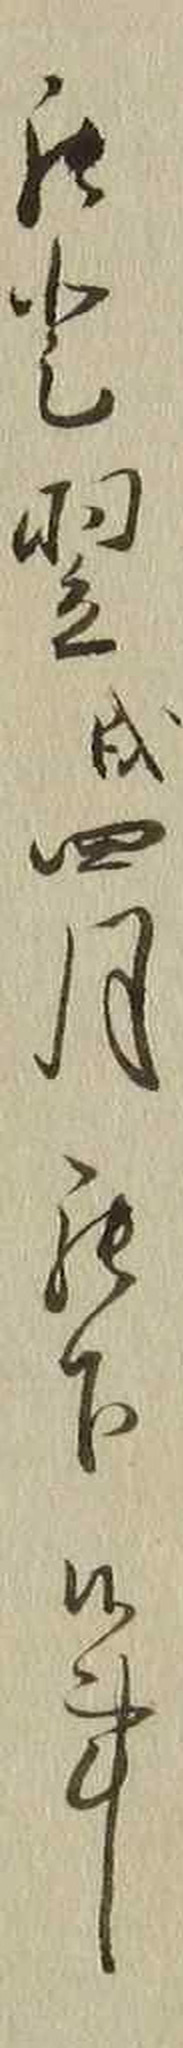罷登翌戌四月罷下候事
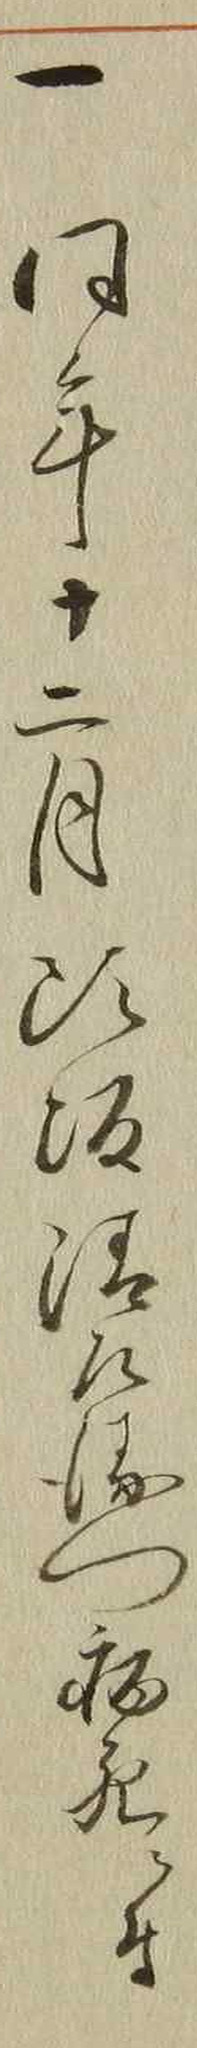一同年十二月頭坂清左衛門病死ニ付
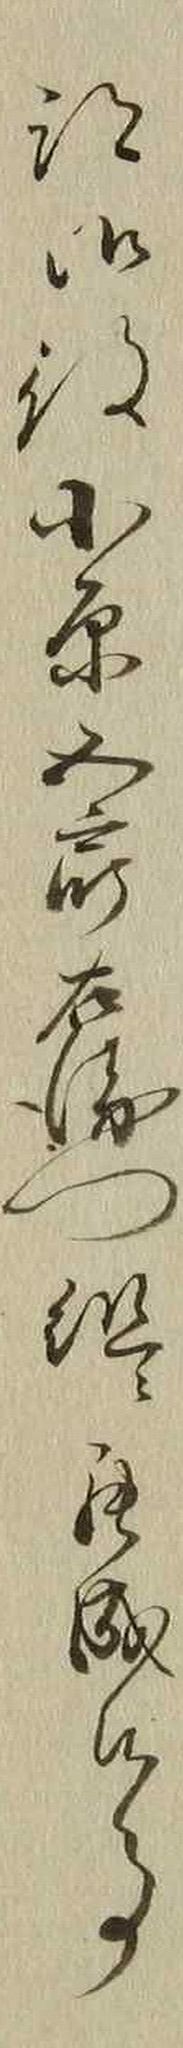跡御役小原五郎右衛門組ニ罷成候事
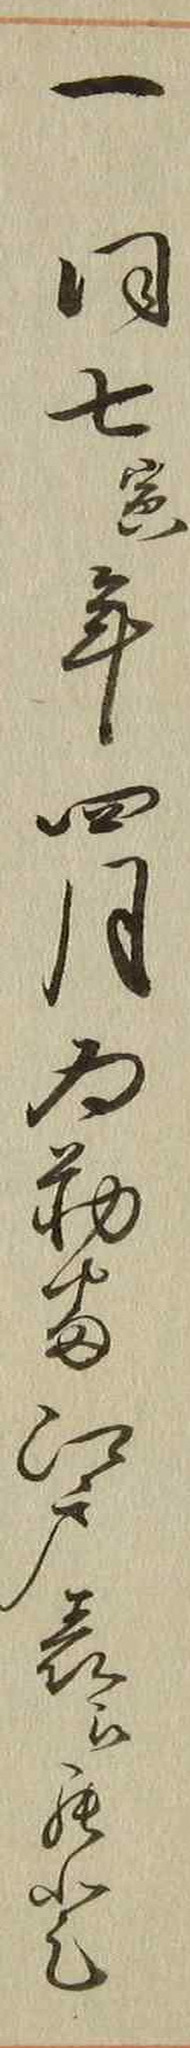一同七寅年四月為勤番江戸表江罷登
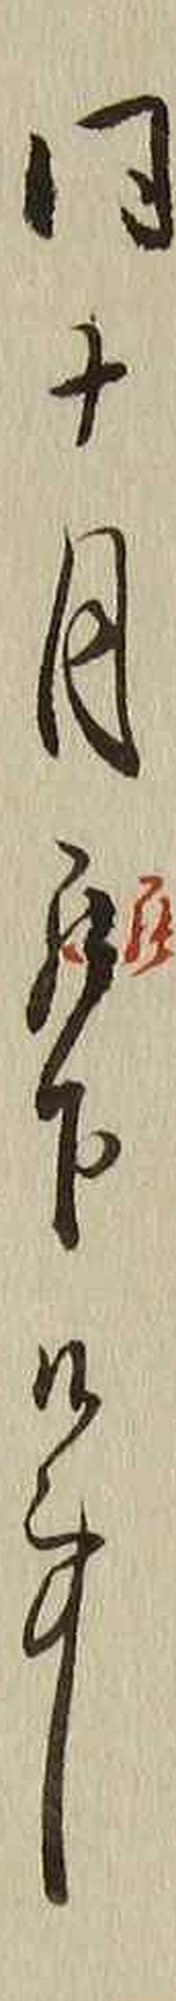同十月罷下候事
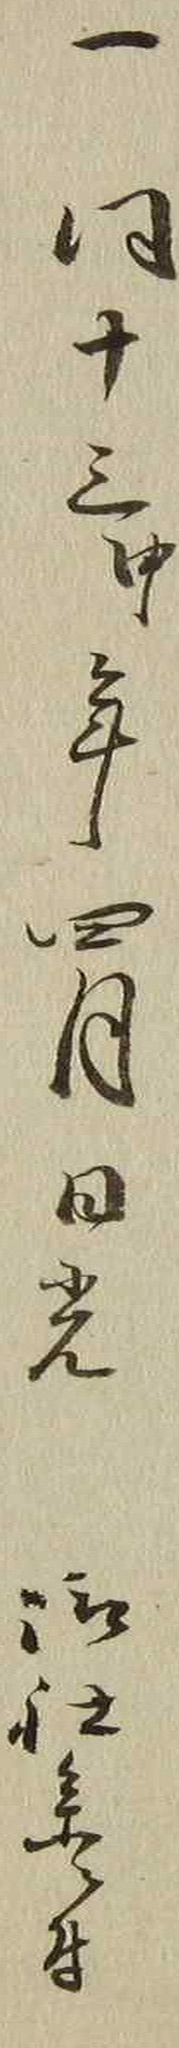一同十三申年四月日光御社参ニ付
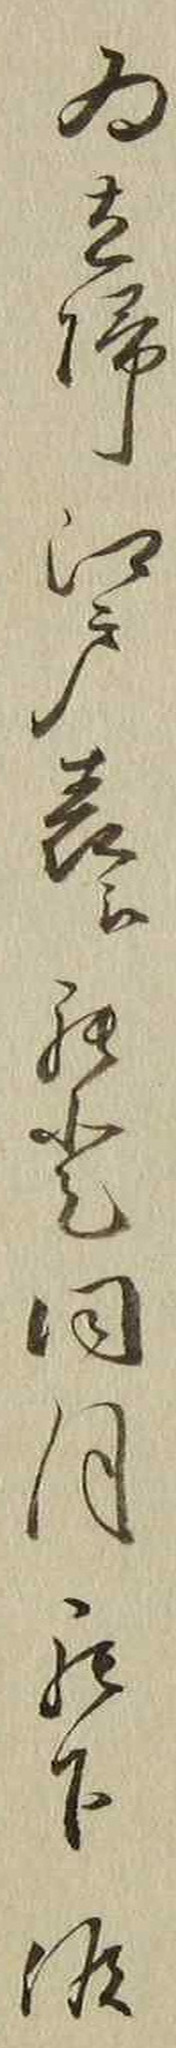為立帰江戸表江罷登同月罷下候
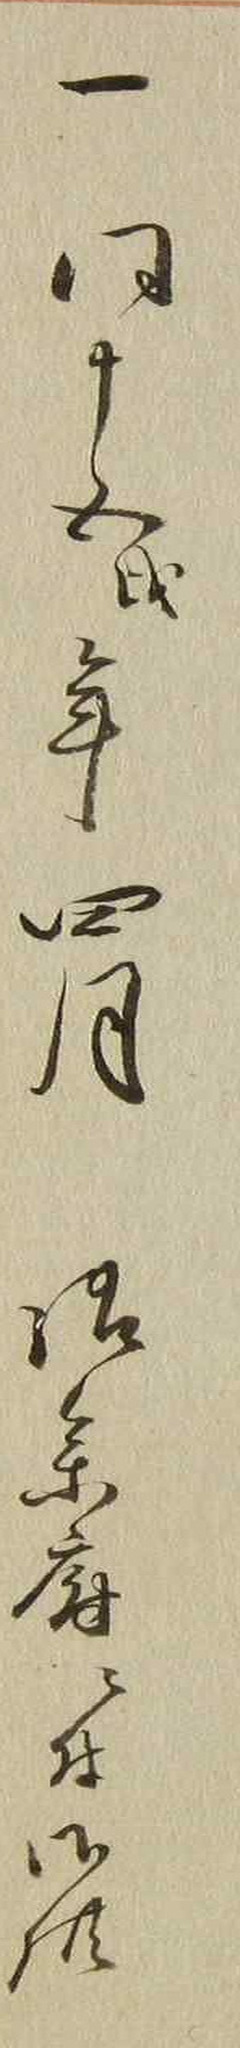一同十五戌年四月御参府ニ付御供
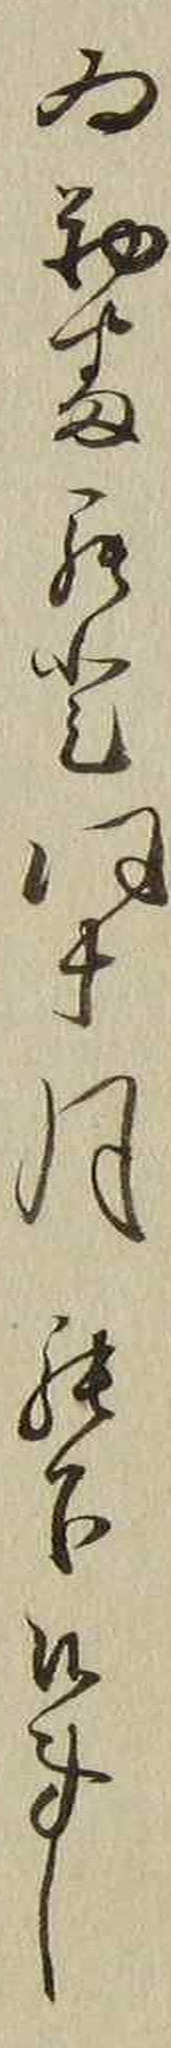為御番罷登同十月罷下候事
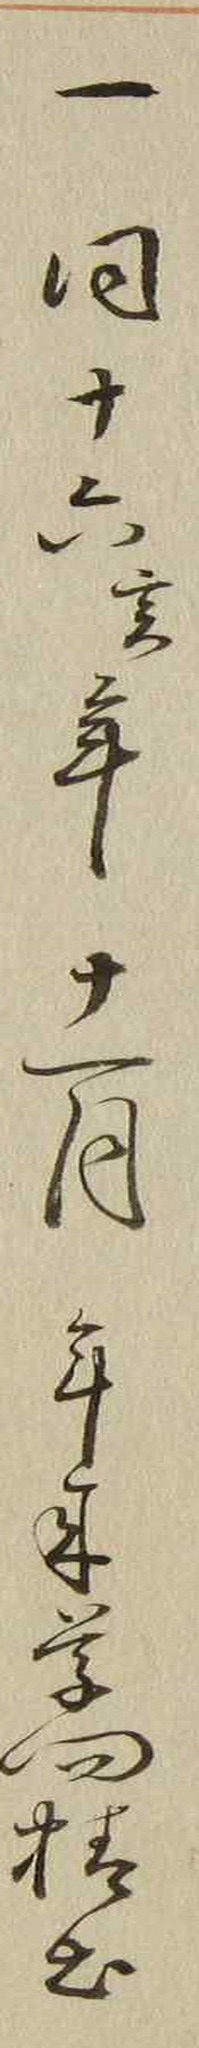一同十六亥年十一月年来学問精出
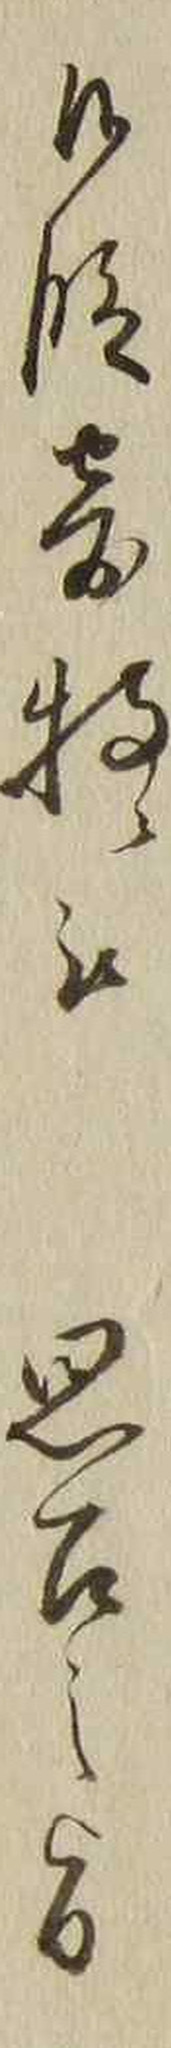候段奇特ニ被思召之旨
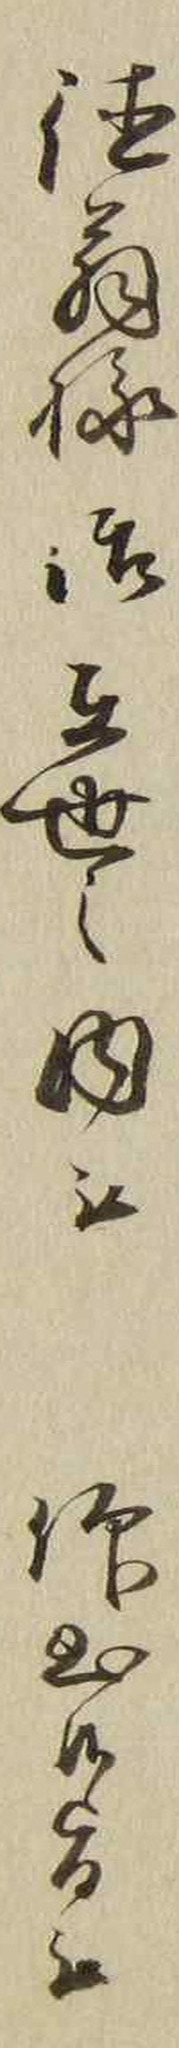徳翁様御在世之内被仰出候旨被

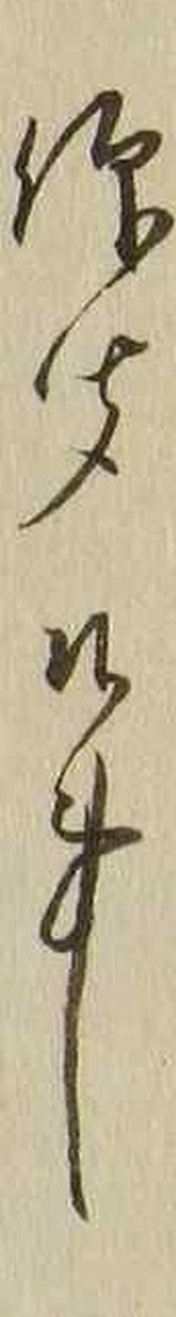仰聞候事
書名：諸士系譜　巻之68　を之部2
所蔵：会津若松市立会津図書館
